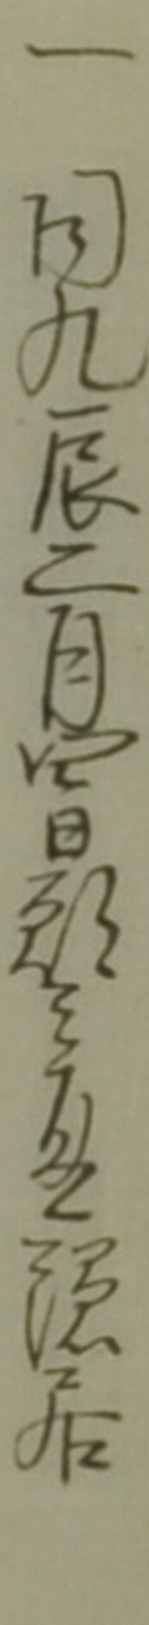一同九辰二月四日願之通隠居
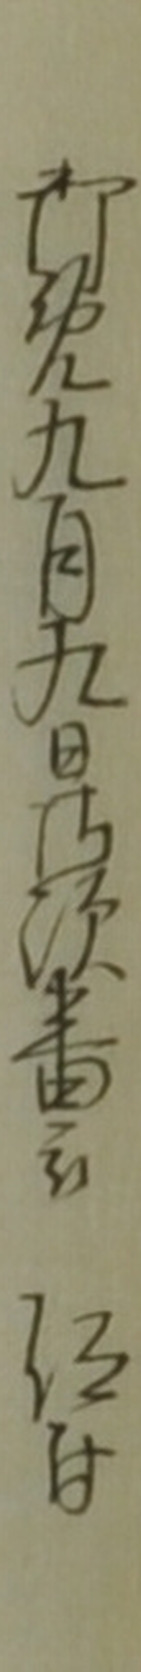御免九月九日御次番被仰付
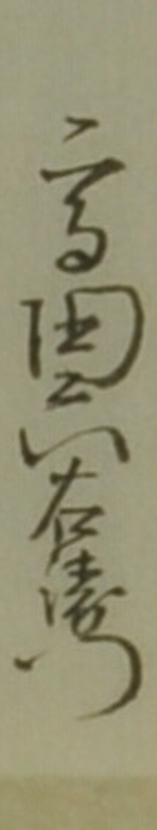高田六右衛門
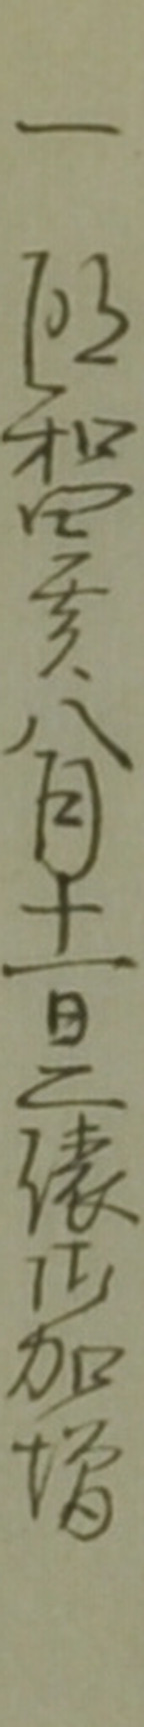一明和四亥八月十一日二俵御加増

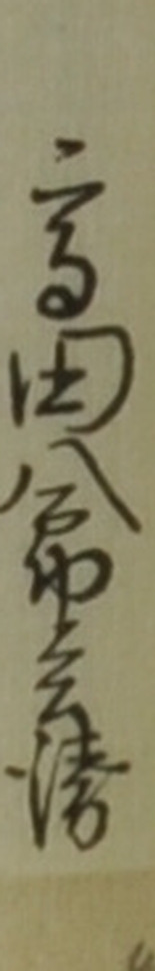高田八郎兵衛
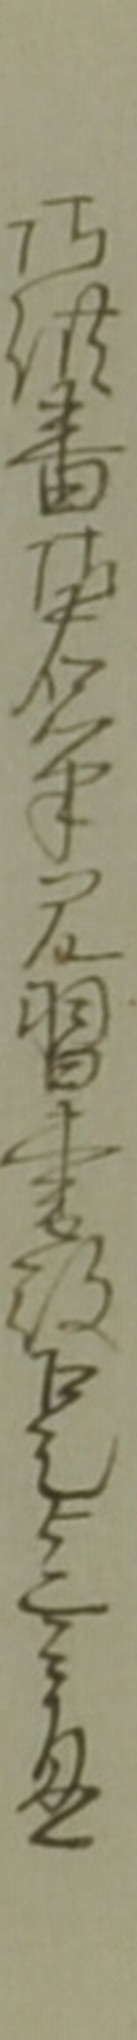御供番御右筆見習書役是迄之通
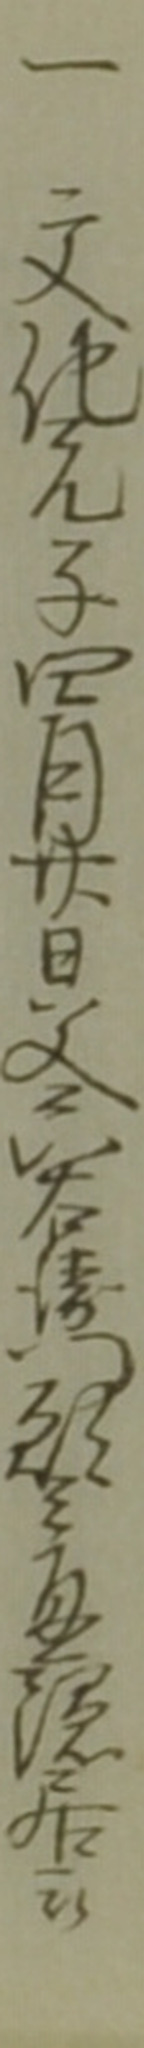一文化元子四月廿日父六右衛門願之通隠居被
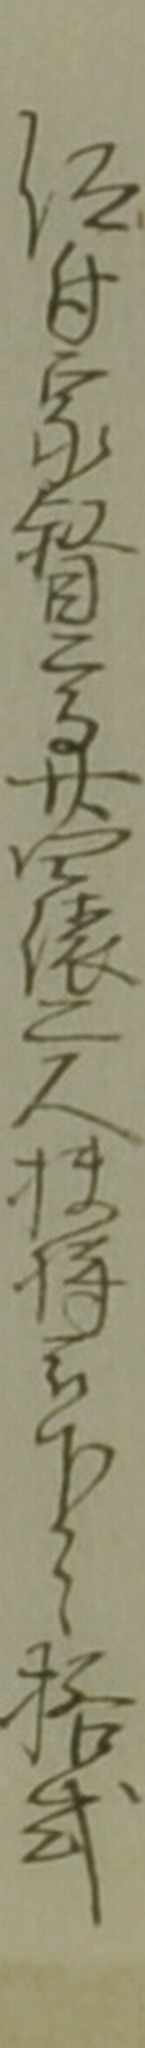仰付家督高廿四俵二人扶持被下之格式
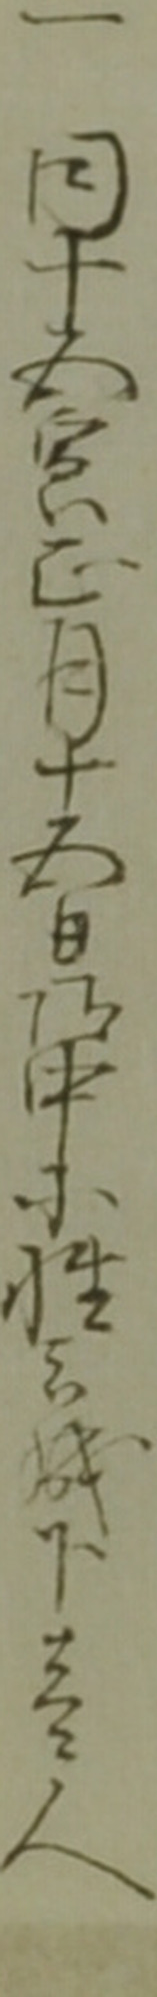一同十五寅正月十五日御中小性被成下壱人
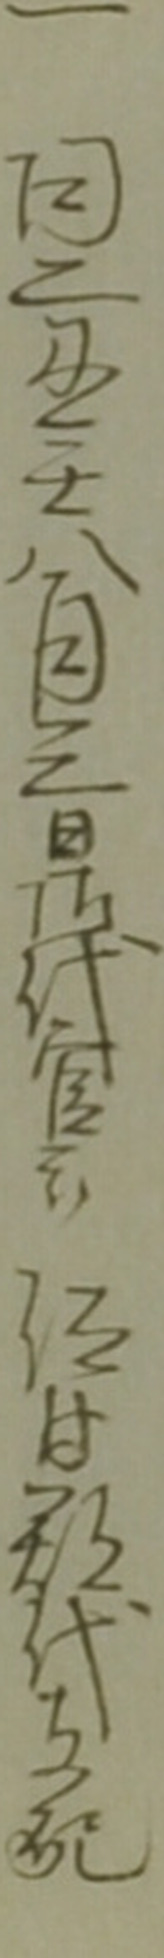一同二丑閏八月三日御代官被仰付郡代支配
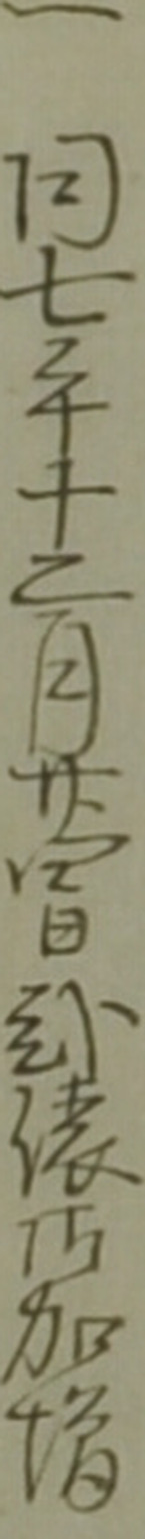一同七午十二月廿四日二俵御加増
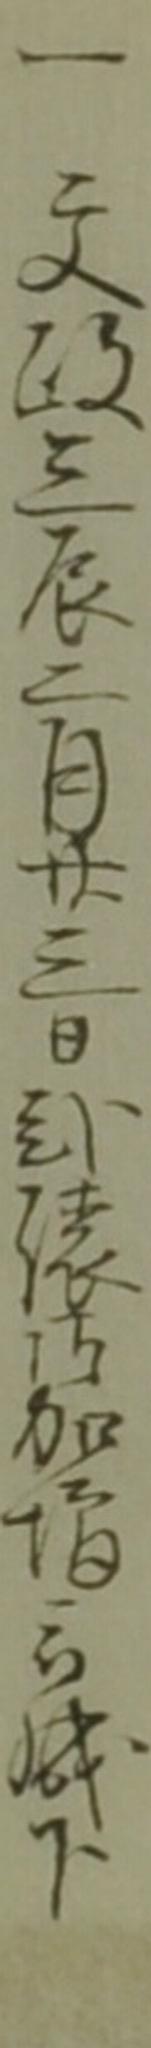一文政三辰二月廿三日弐俵御加増被成下
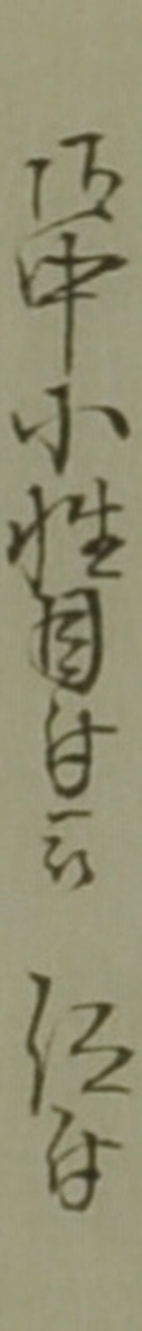御中小性目付被仰付
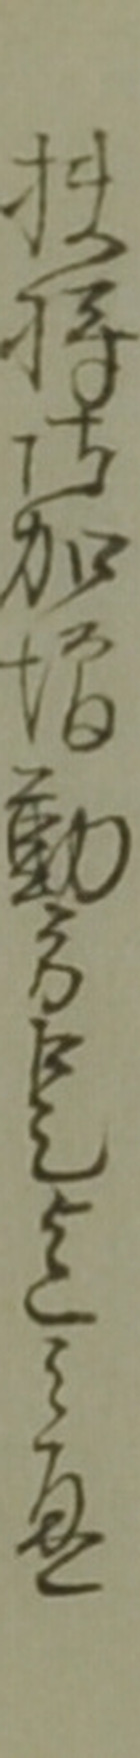扶持御加増勤方是迄之通
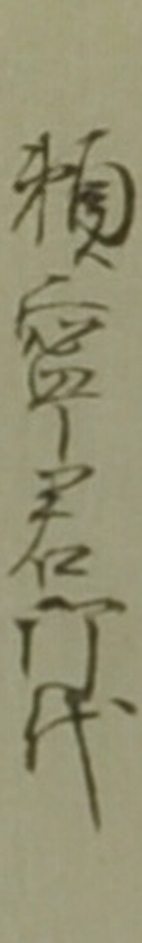頼寧君御代
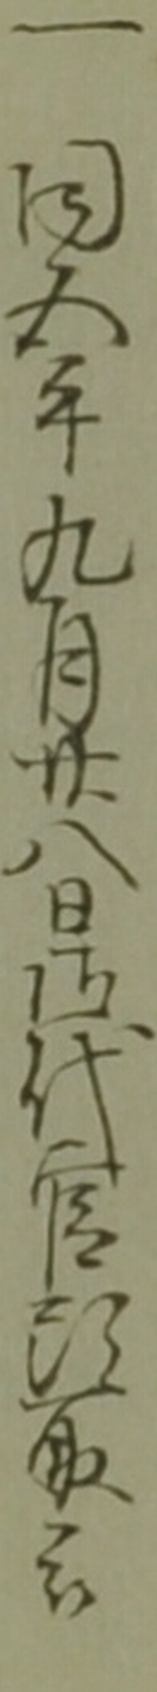一同五午九月廿八日御代官頭取被
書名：無足諸士勤仕録（一）
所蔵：伊那市立高遠町図書館・合同会社AMANE
